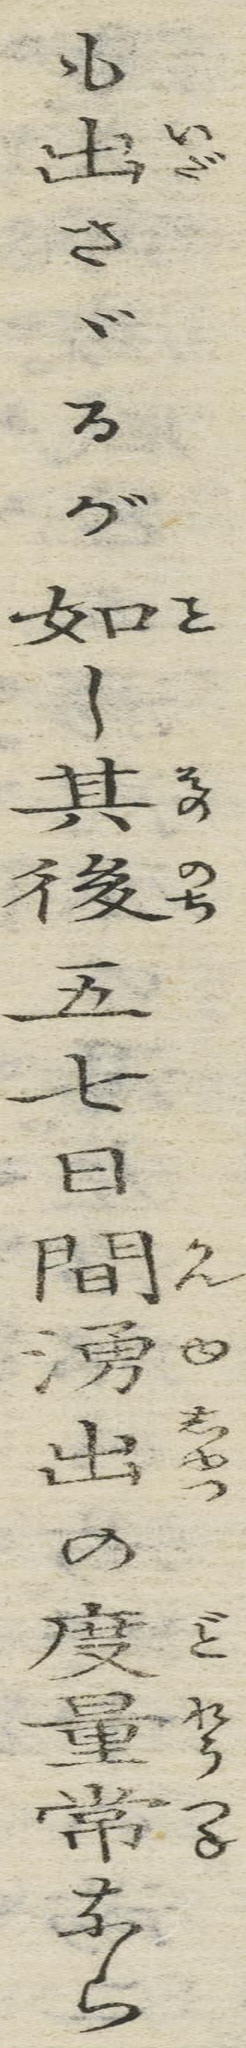も出さゞるが如し其後五七日間湧出の度量常なら
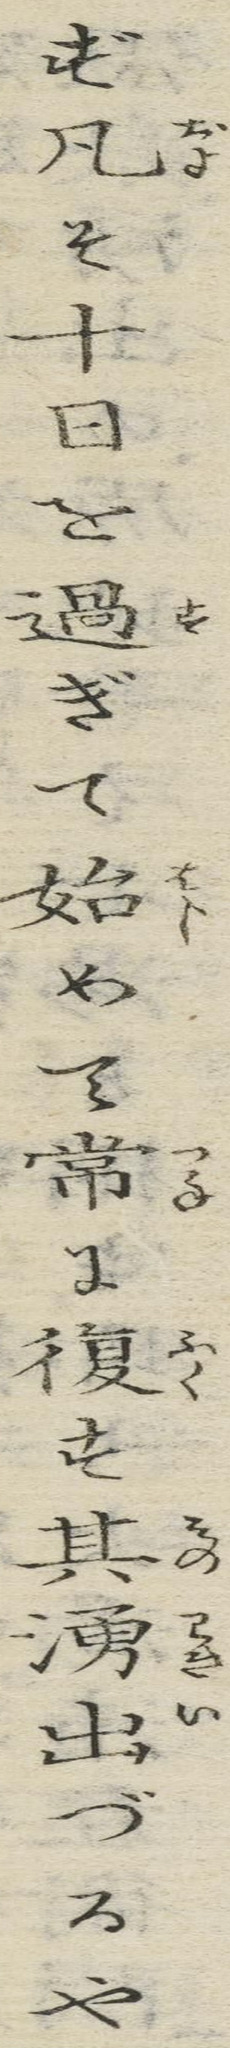ず凡そ十日を過ぎて始めて常に復す其湧出づるや
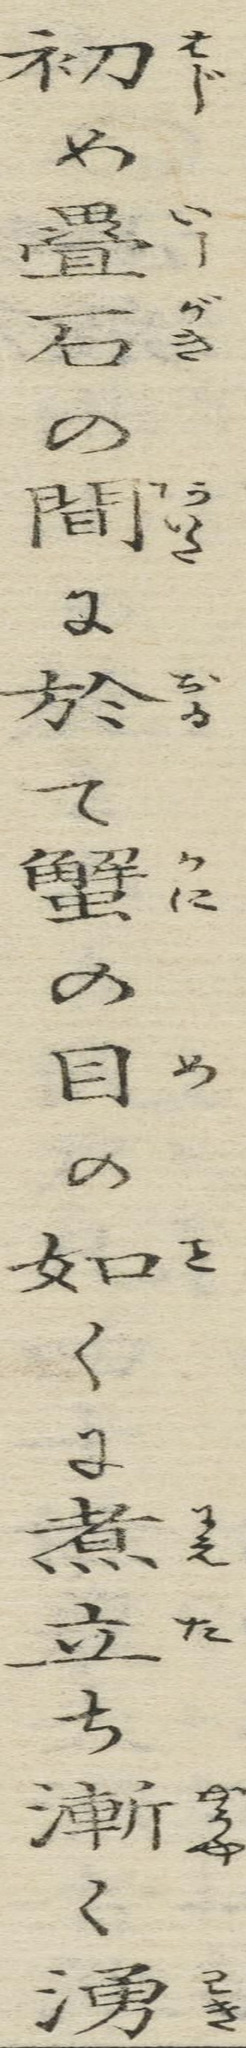初め畳石の間に於て蟹の目の如くに煮立ち漸く湧
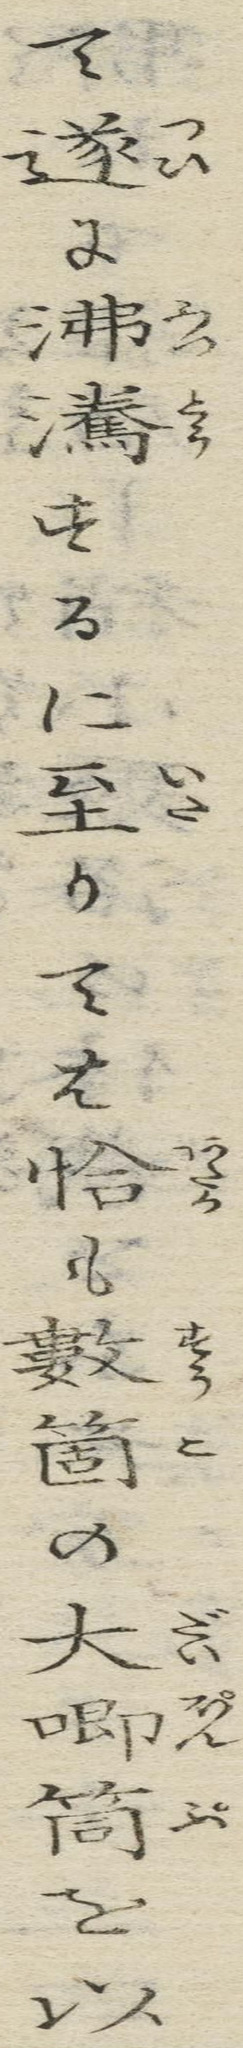て遂に沸騰するに至りては恰も数個の大唧筒を以
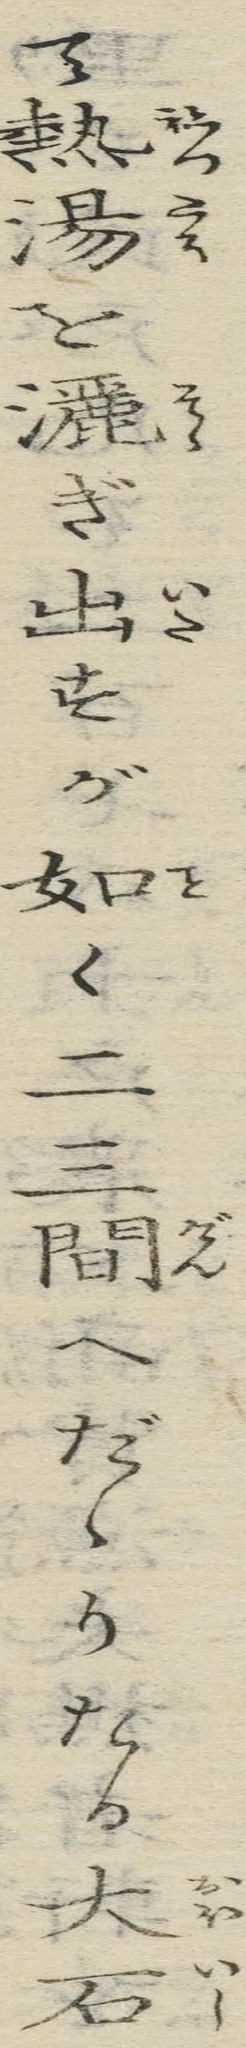て熱湯を灑ぎ出すが如く二三間へだゝりたる大石
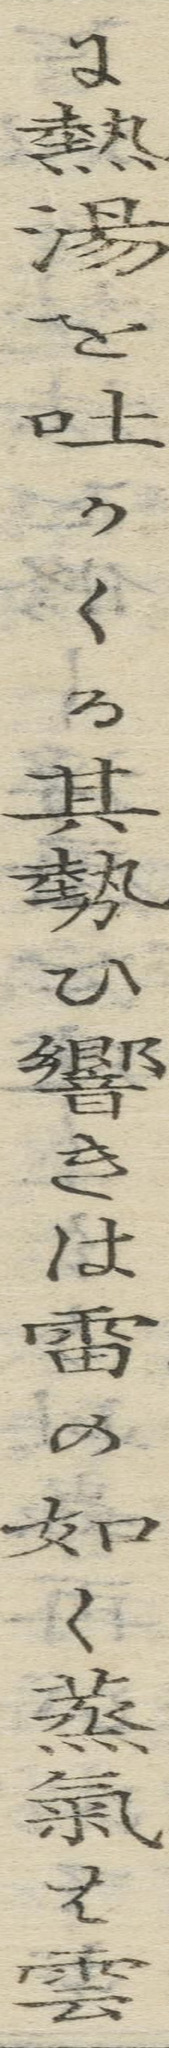に熱湯を吐かくる其勢ひ響きは雷の如く蒸気は雲
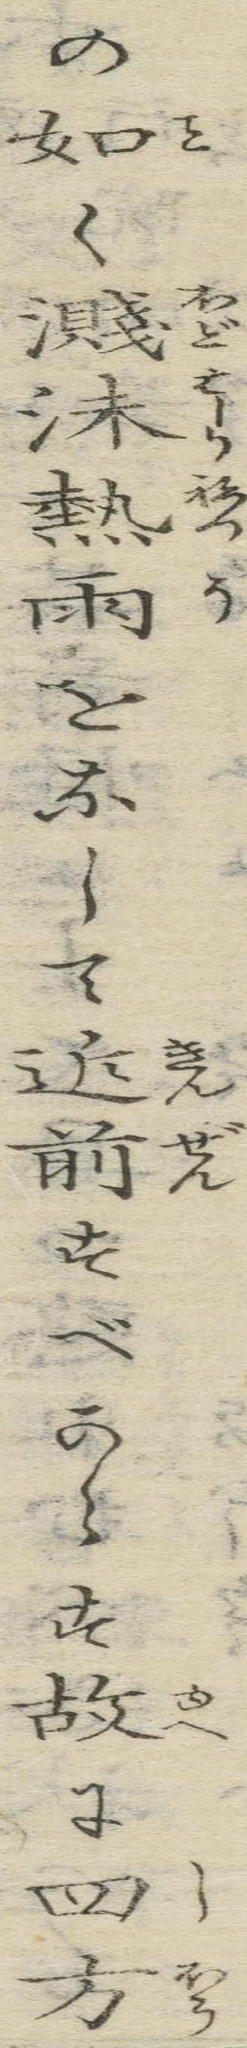の如く濺沫熱雨をなして近前すべからす故に四方
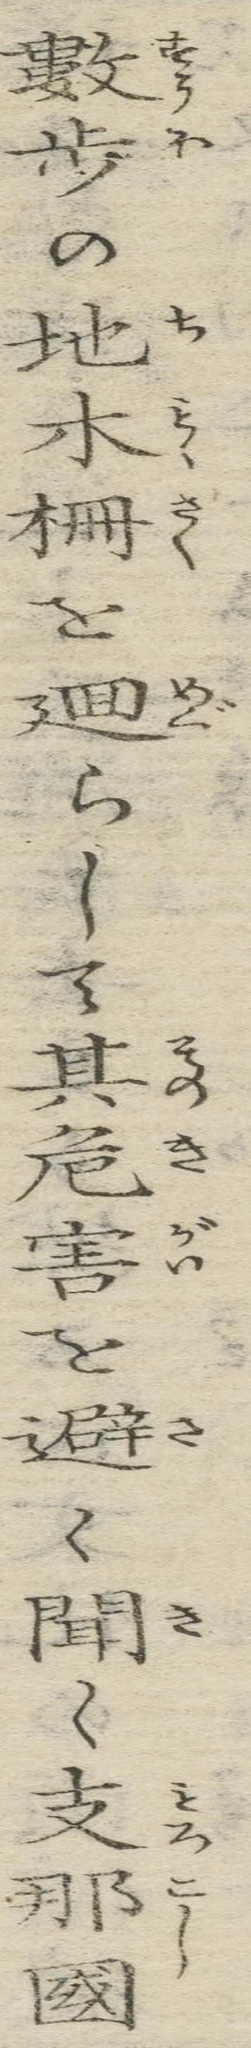数歩の地木柵廻らして其危害を避く聞く支那国
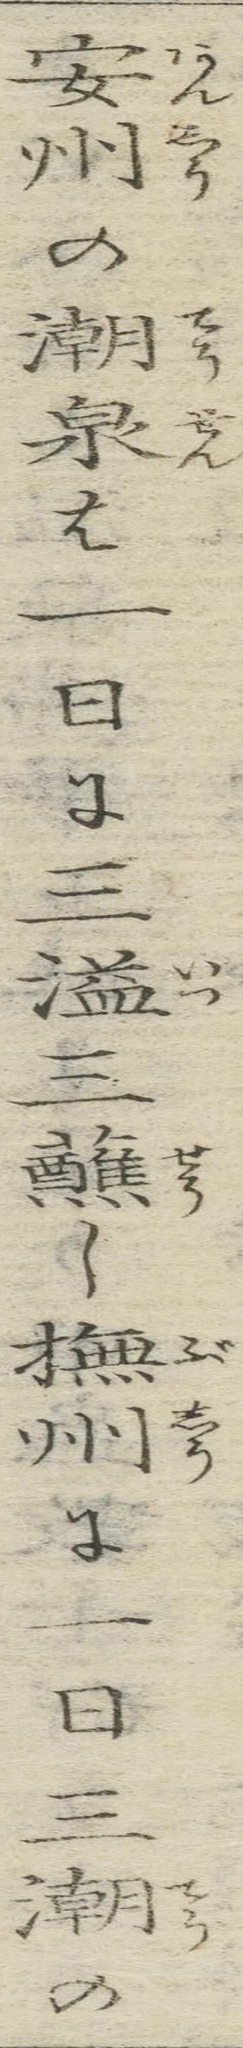安州の潮泉は一日に三溢三蘸し撫州に一日三潮の
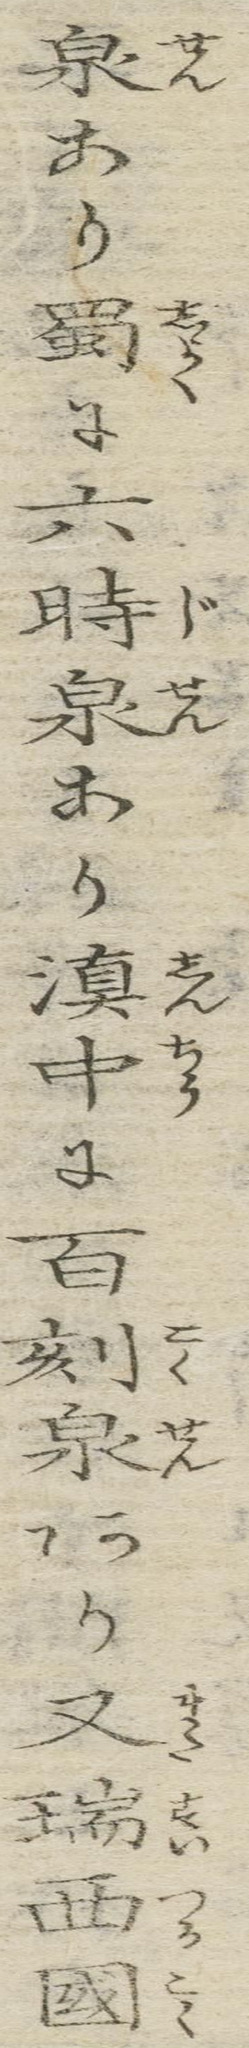泉あり蜀に六時泉あり滇中に百刻泉あり又瑞西国
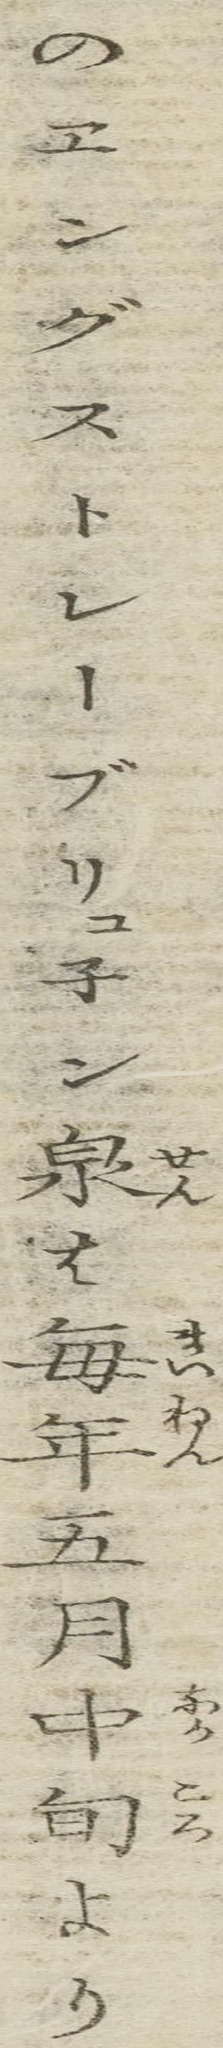のエングストレーブリュネン泉は毎年五月中旬より
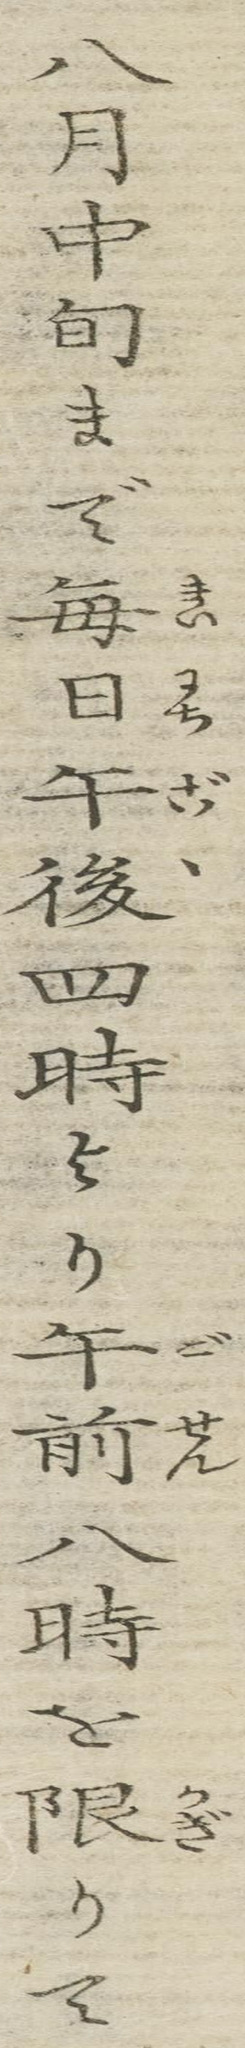八月中旬まで毎日午後四時より午前八時を限りて
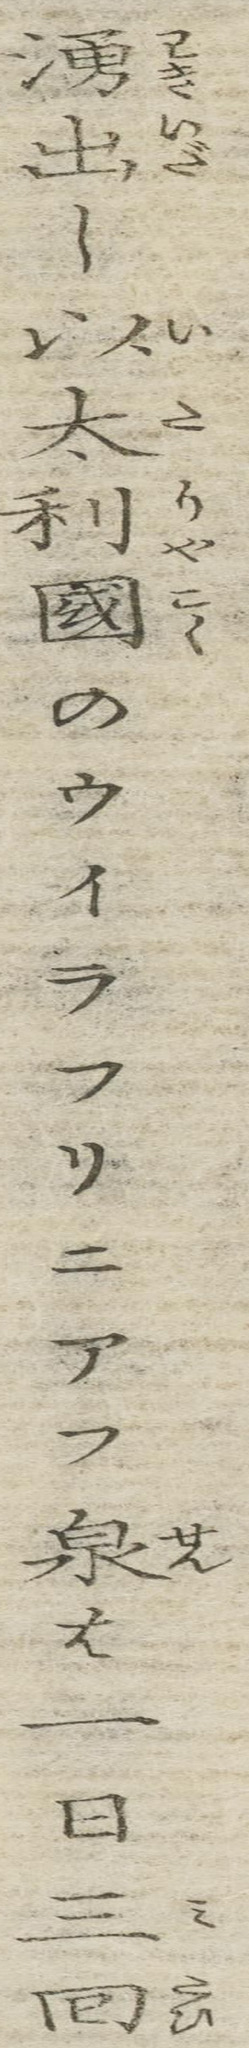湧出し以太利国のウイラフリニアフ泉は一日三回
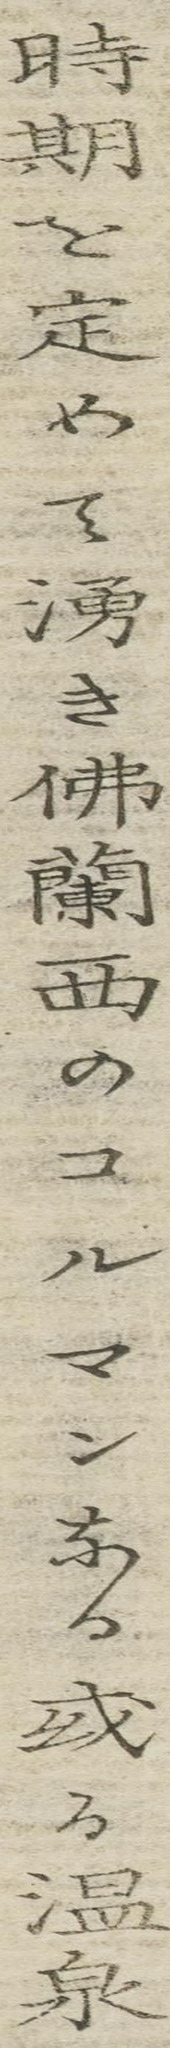時期を定めて湧き仏蘭西のコルマンなる或る温泉
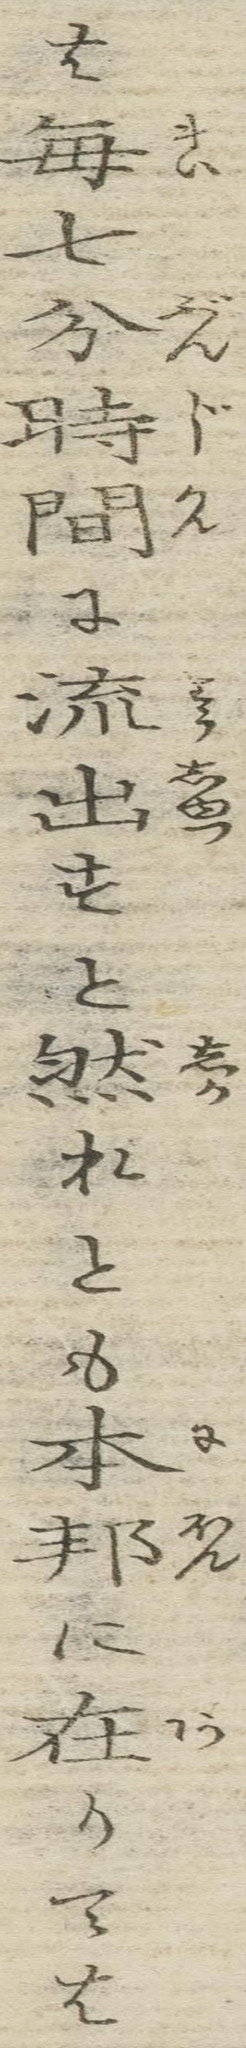は毎七分時間に流出すと然れとも本邦に在りては

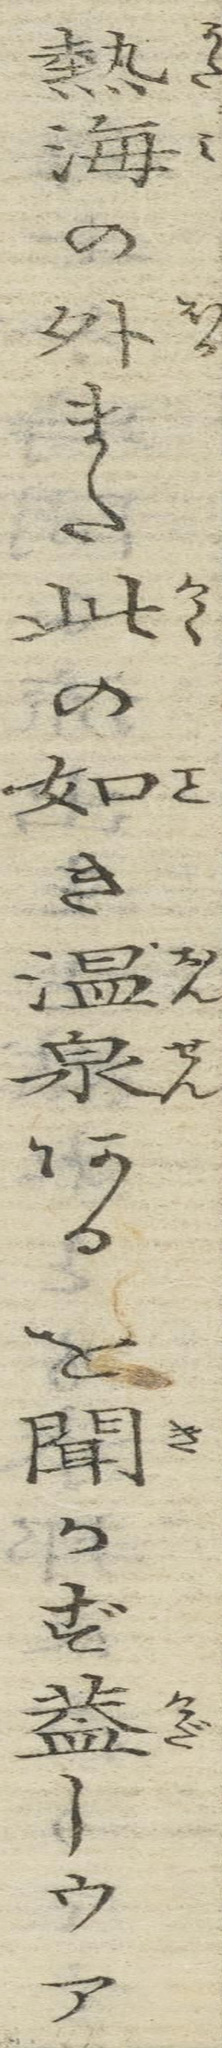熱海の外また此の如き温泉あるを聞かず蓋しウア
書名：豆州熱海誌　完
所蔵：東京大学地震研究所図書室 Earthquake Research Institute Library, The University of Tokyo, JAPAN
